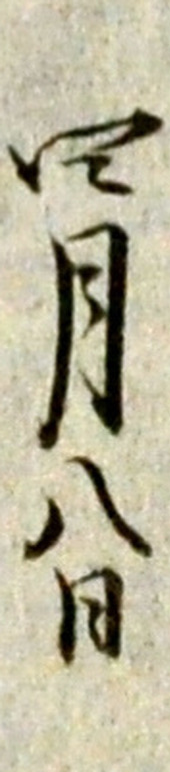四月八日
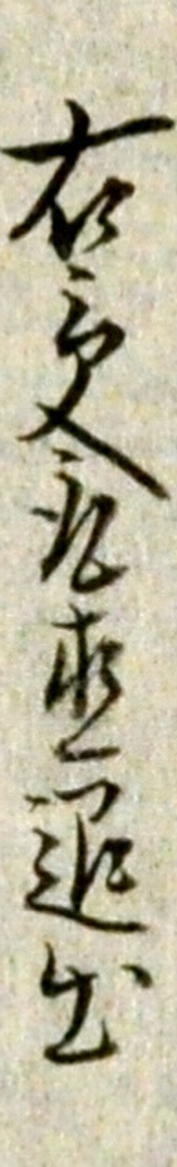右受取直退出
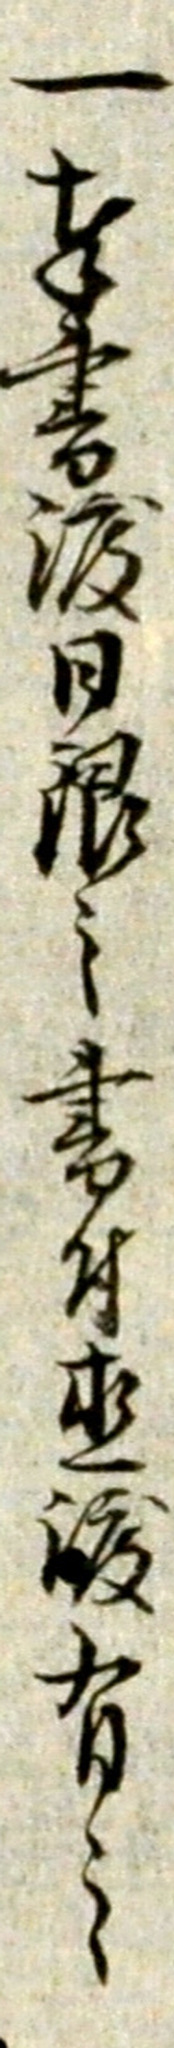一奉書渡日限之書付直渡有之
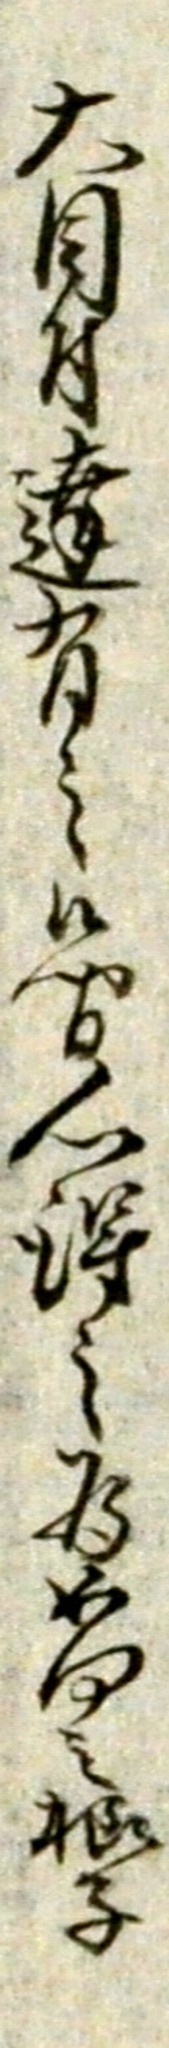大目付達有之候間心得之為如何之様子
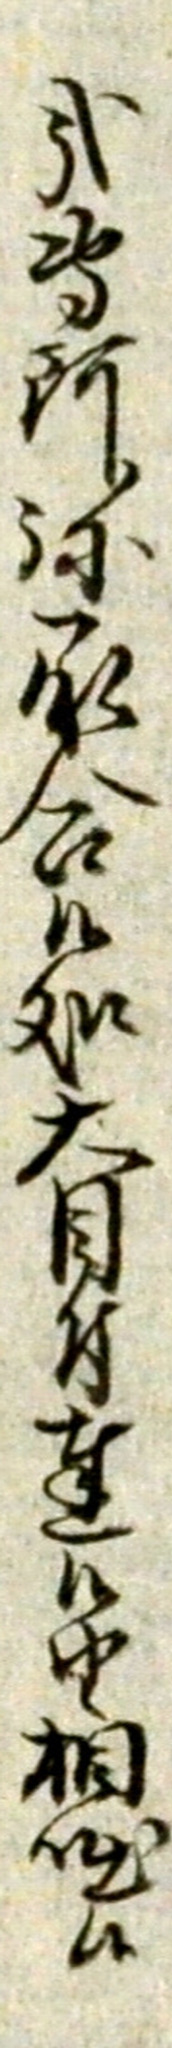哉専阿弥承合候処大目付達候由相咄候
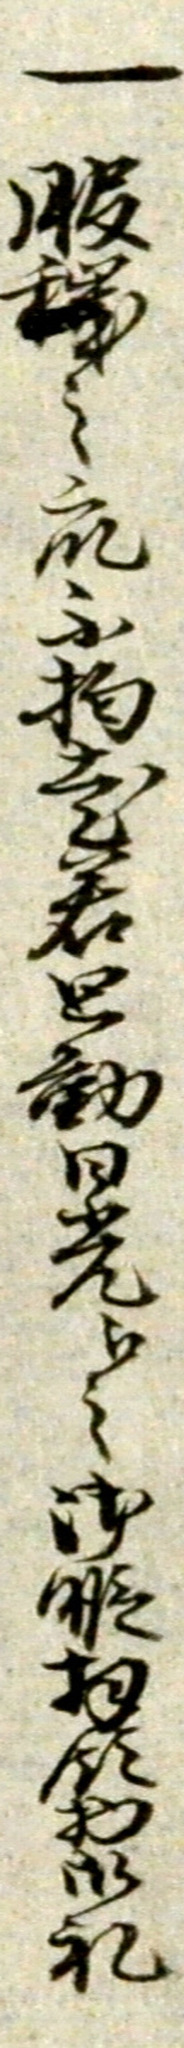一服穢之衆不拘老若廻勤日光江之御暇拝領物御礼
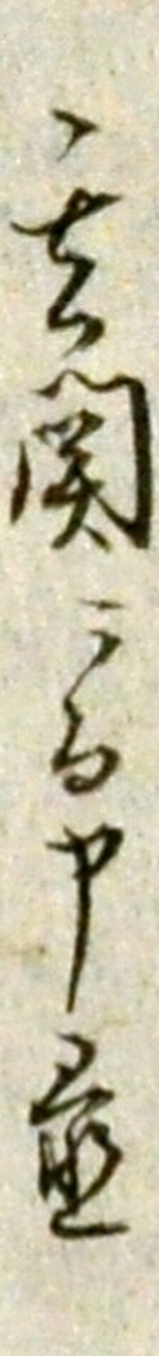玄関ニ而申置
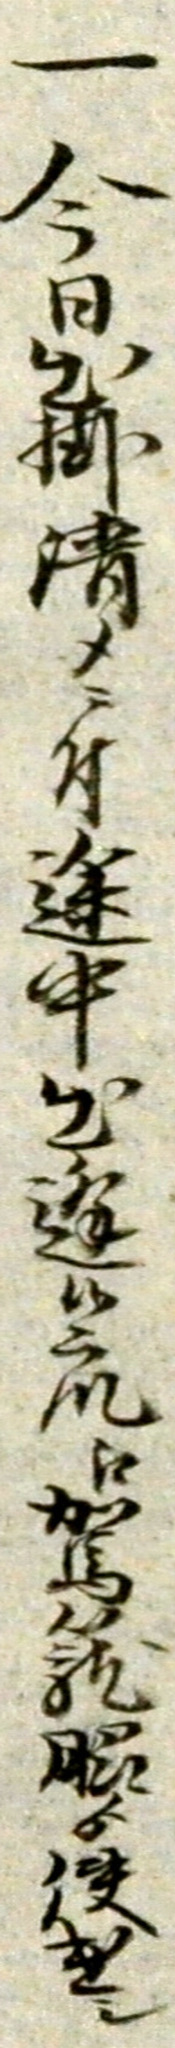一今日出掛清メ二付途中出逢候衆江駕籠脇ゟ使遣し
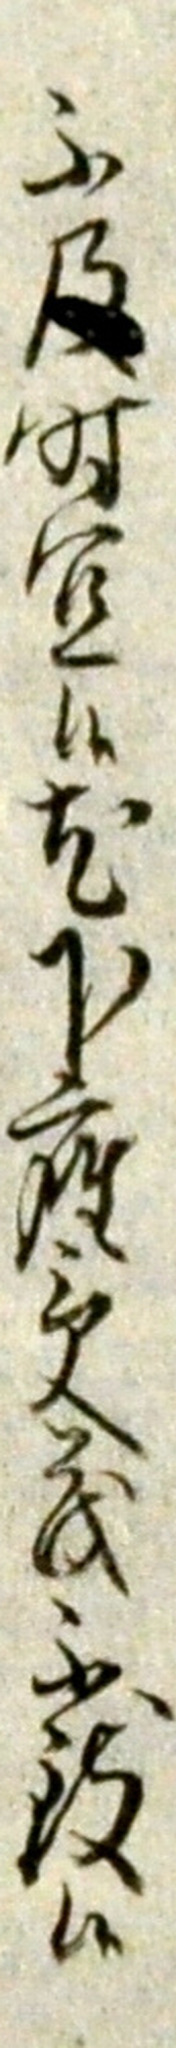不及時宜候尤下座受茂不致候

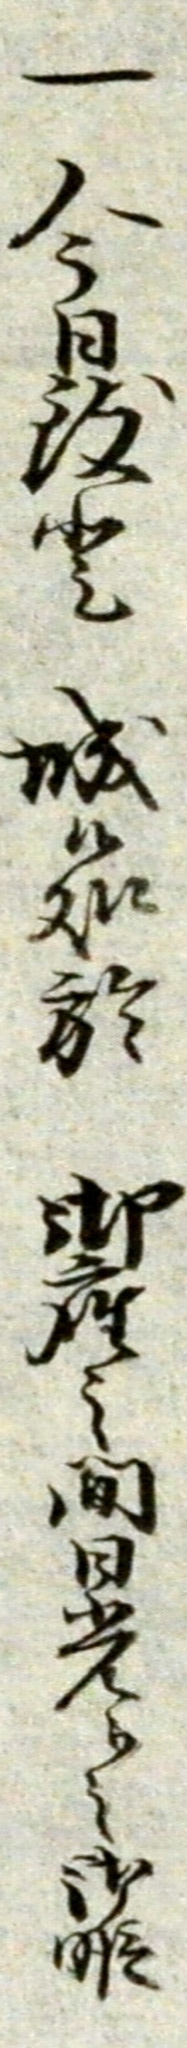一今日致登城候処於御座之間日光江之御暇
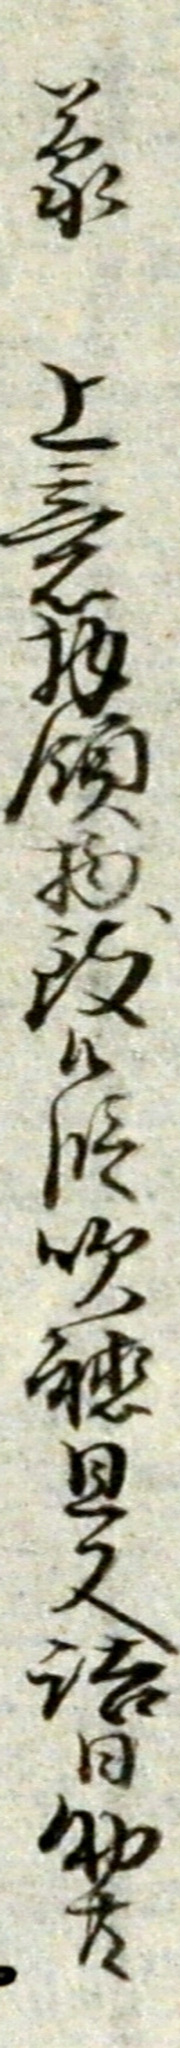蒙上意拝領物致候段吹聴且又詰日助共
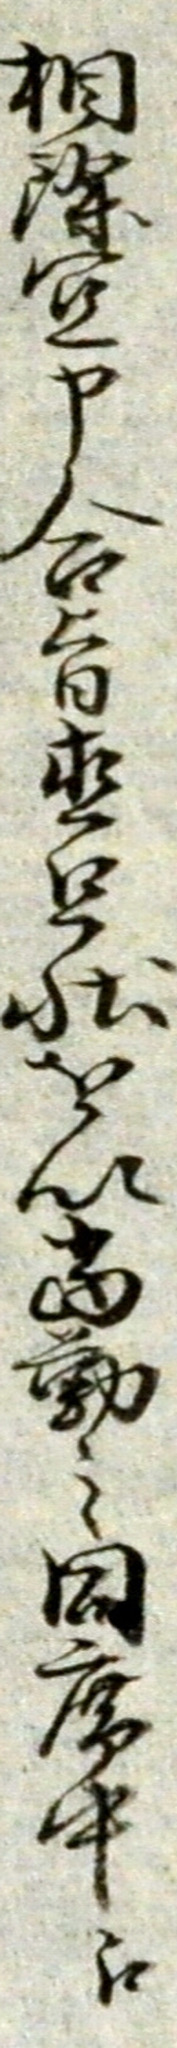相除宜申合旨直廻状を以当勤之同席中江
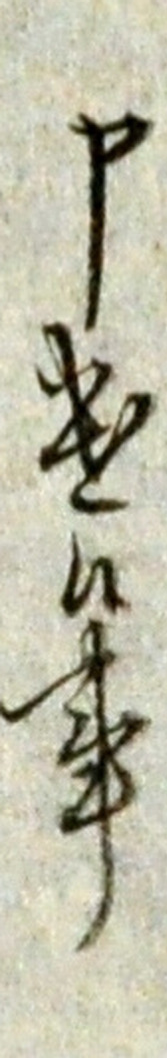申遣候事
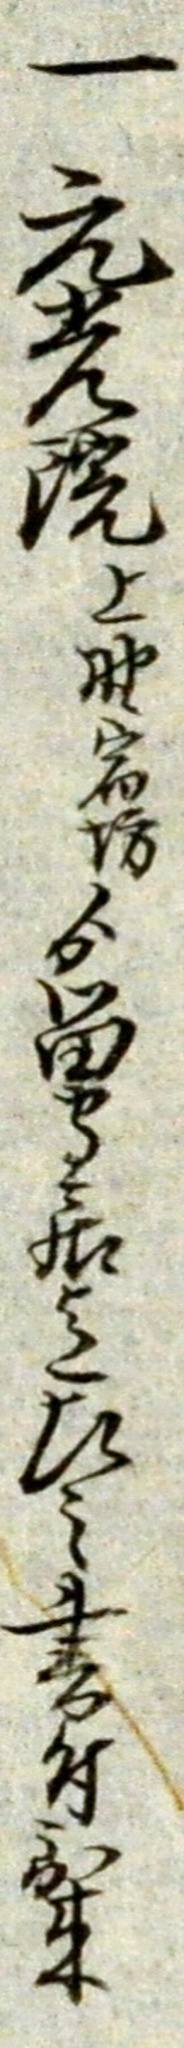一元光院上野宿坊ゟ留守居迄左之書付到来
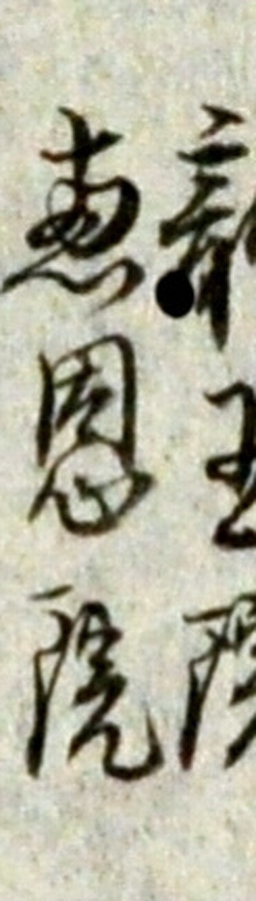恵恩院
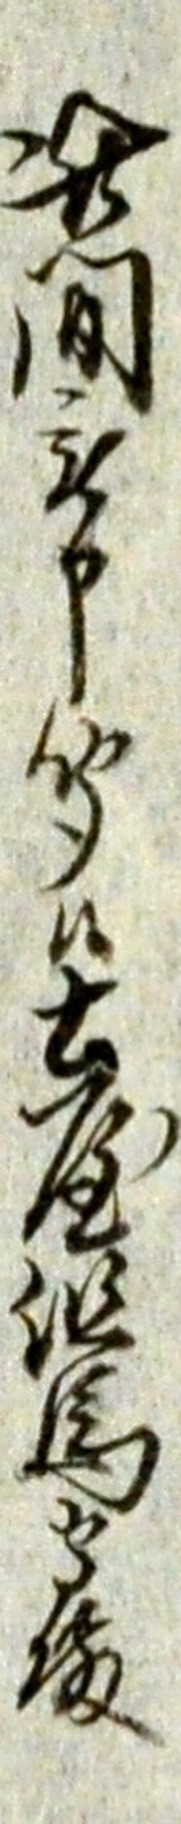此間被申聞候土屋但馬守殿
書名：日光御名代相勤候節ノ留
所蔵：伊那市立高遠町図書館・合同会社AMANE
